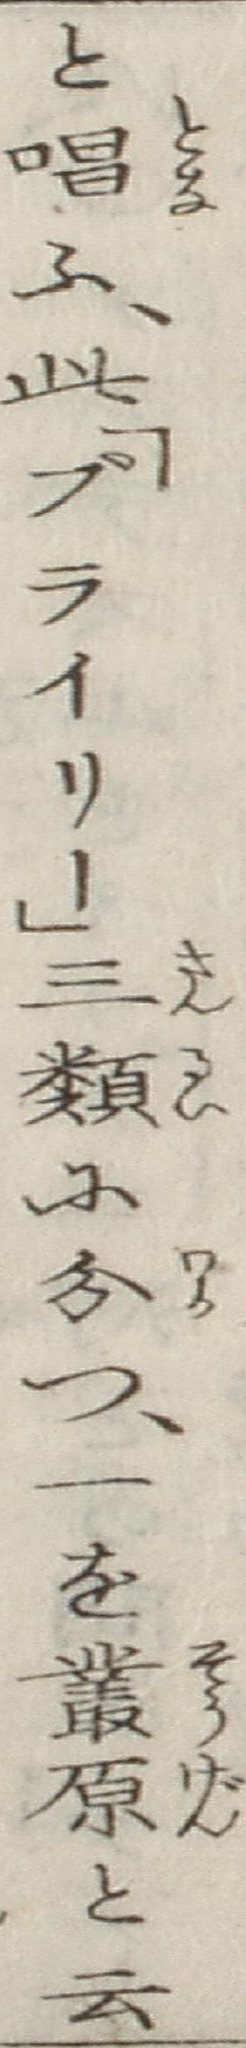と唱ふ、此「プライリー」三類に分つ、一を叢原と云
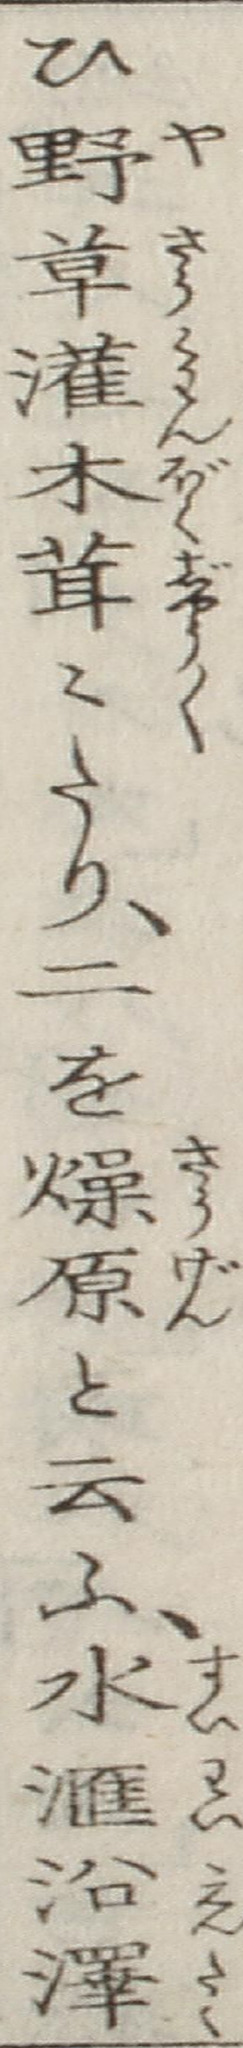ひ野草灌木茸〻たり、二を燥原と云ふ、水匯沿澤
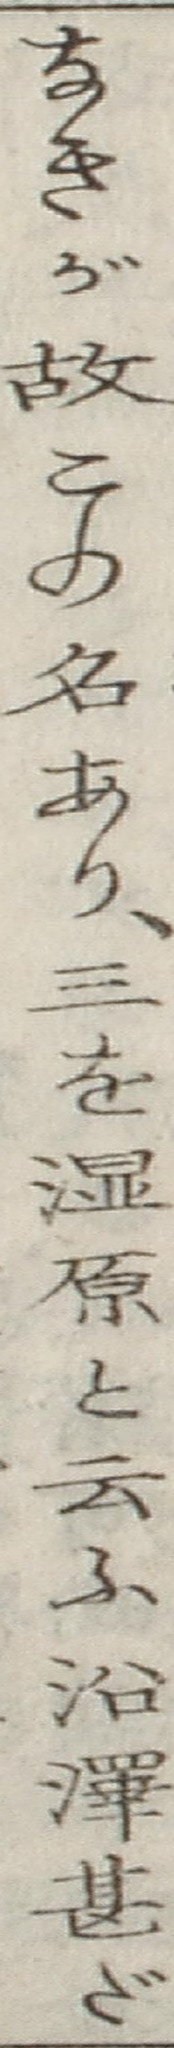なきが故この名あり、三を湿原と云ふ沿澤甚だ
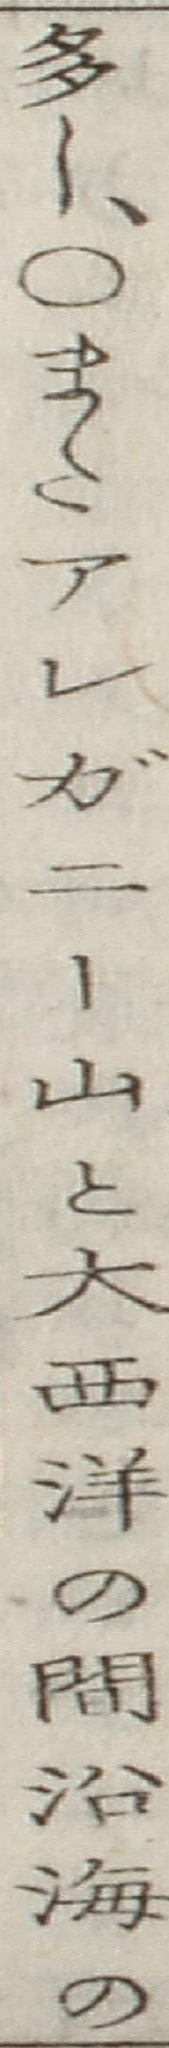多し、〇またアレガニー山と、大西洋の間沿海の
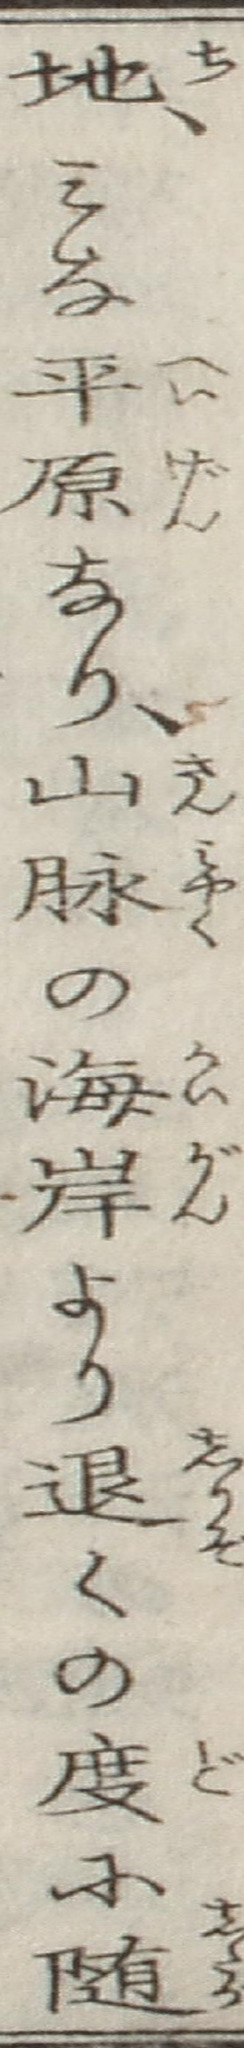地、みる平原なり、山脈の海岸より退くの度に随
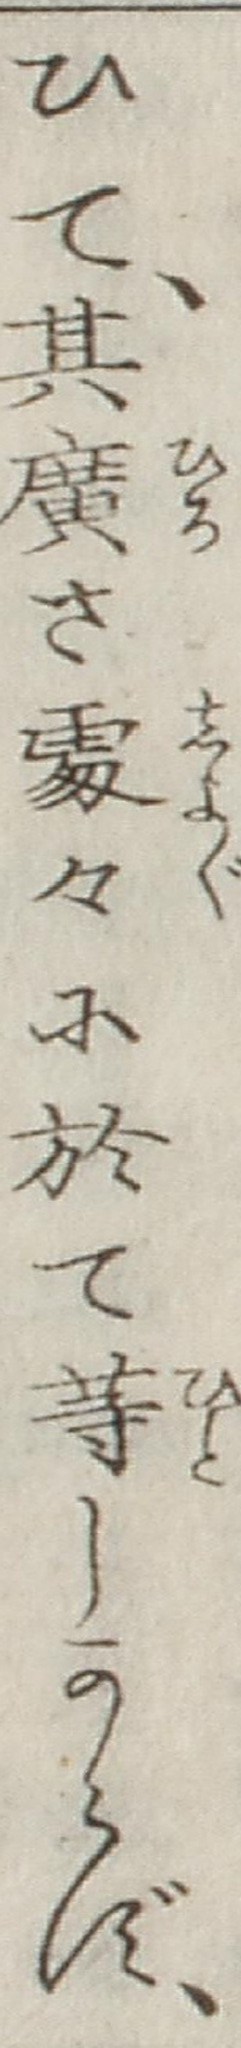ひて、其廣さ処々に於て等しまず、
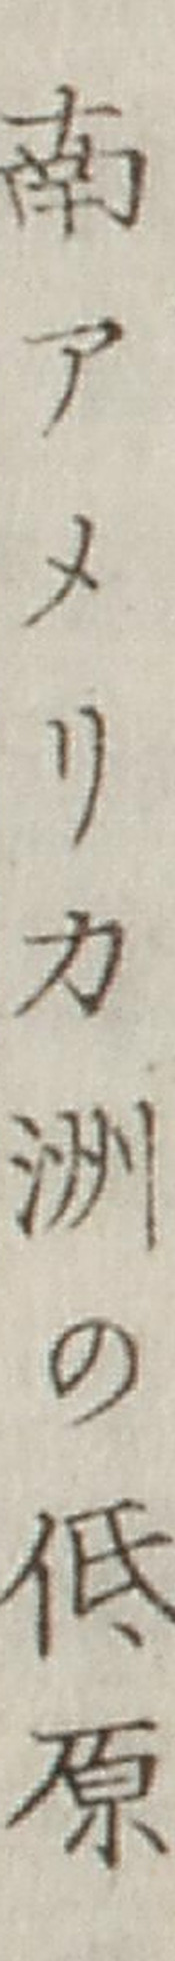南アメリカ洲の低原

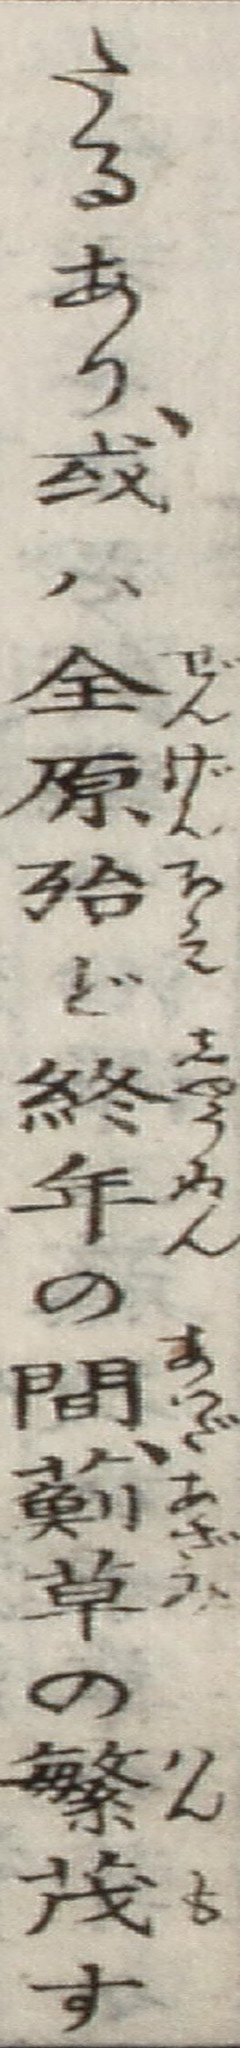たるあり、或ハ全原殆ど終年の間、薊草の繁茂す
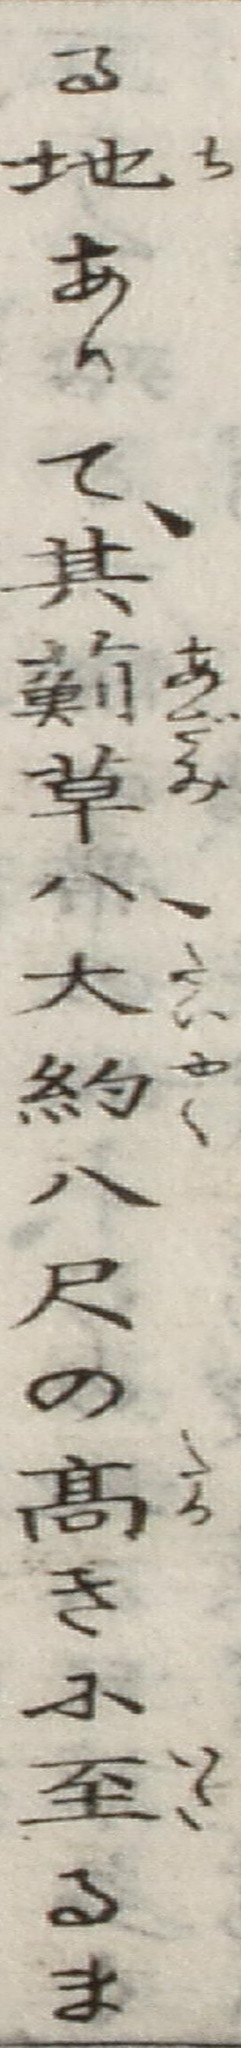る地ありて、其薊草は、大約八尺の高きに至るま
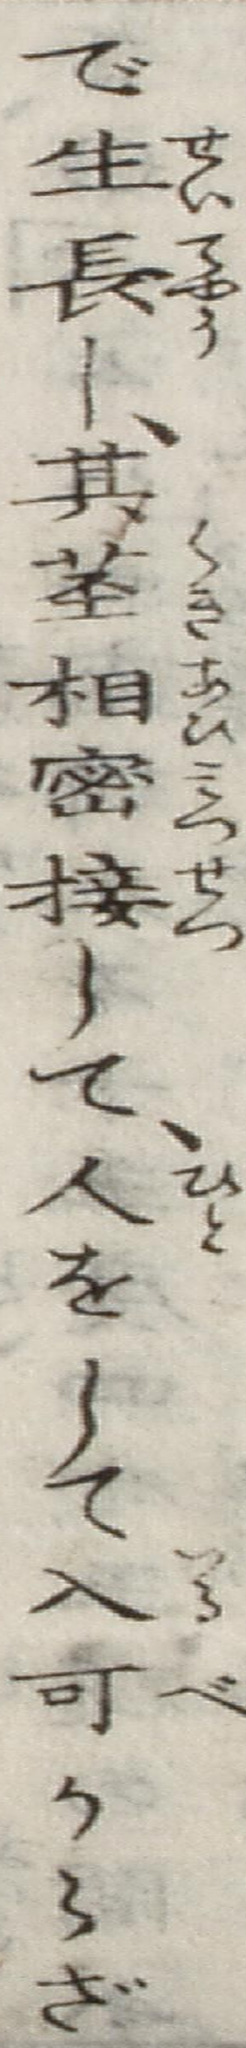で生長し、其茎相密接して、人をして入可からざ
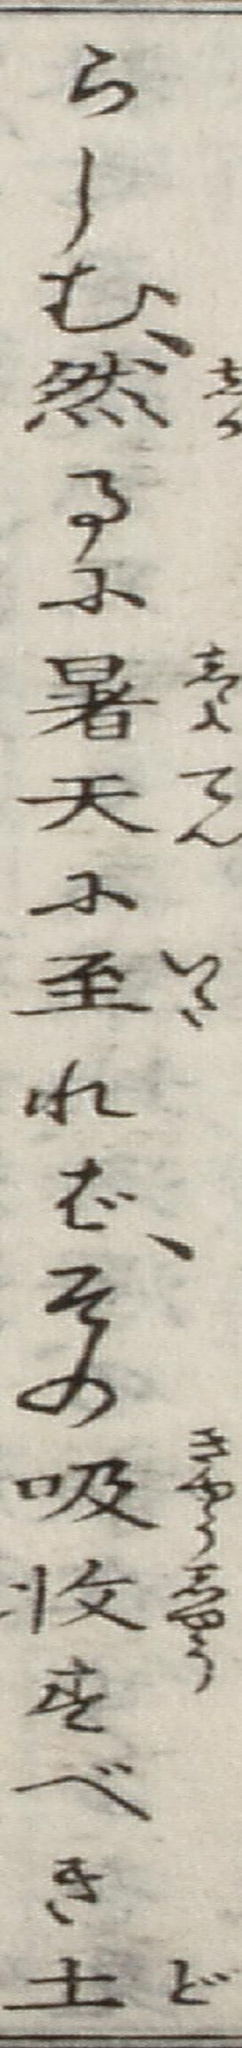らしむ、然るに暑天に至れば、その吸収すべき土
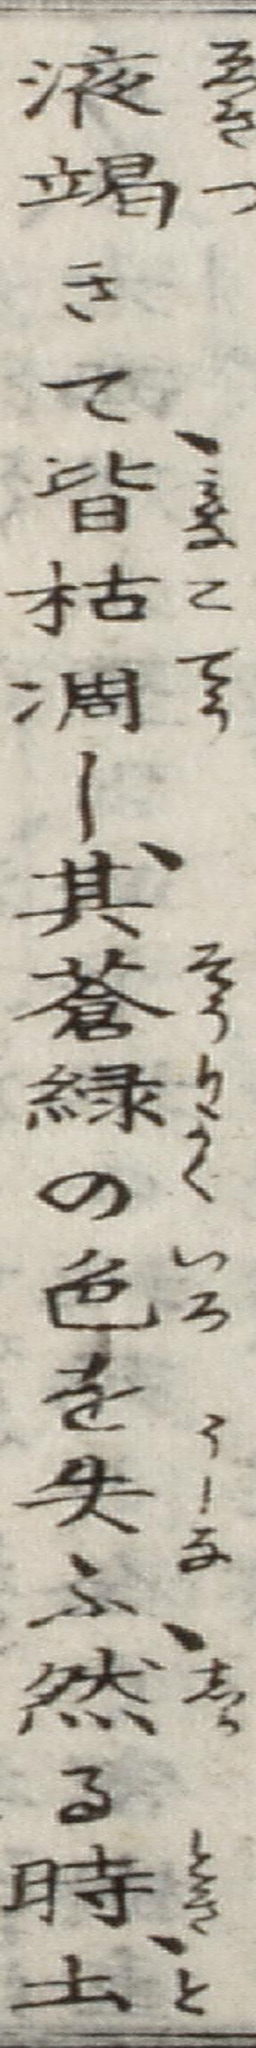液尽きて、皆枯凋し、其蒼緑の色を失ふ、然る時、土
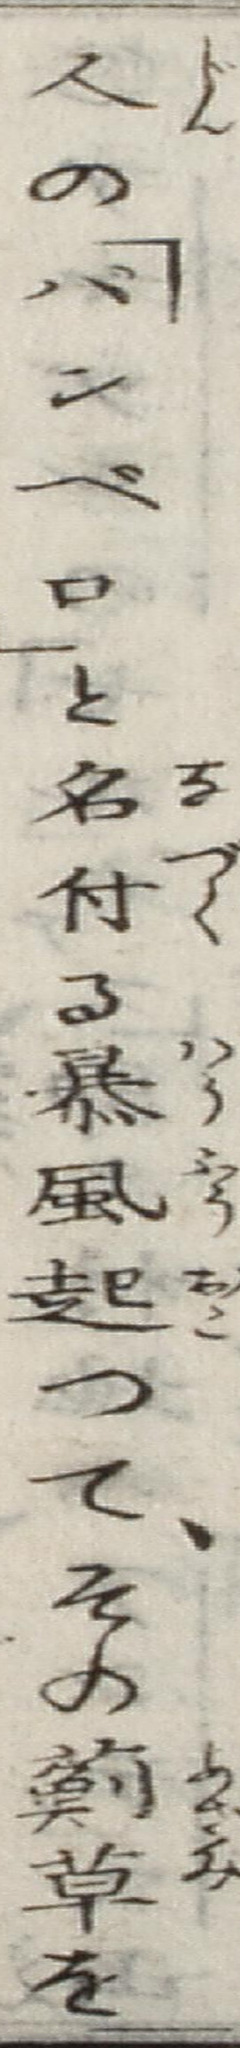人の「パンペロ」と名付る暴風起つて、その薊草を
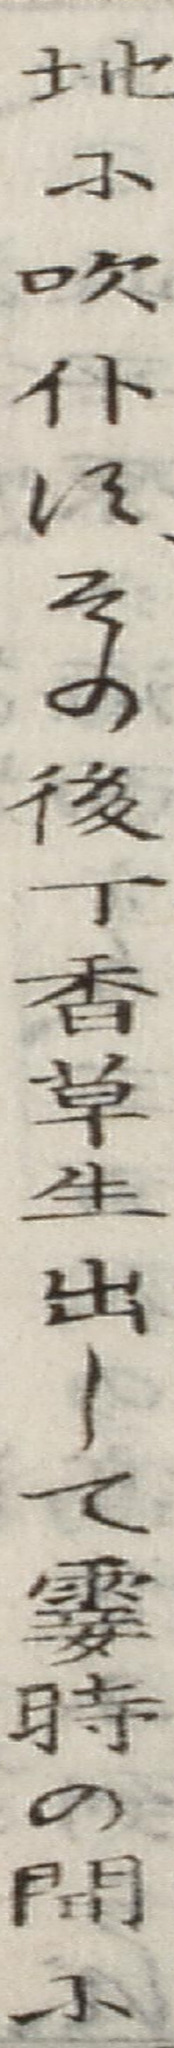地に吹伏す、その後丁香草生出して霎時の間に
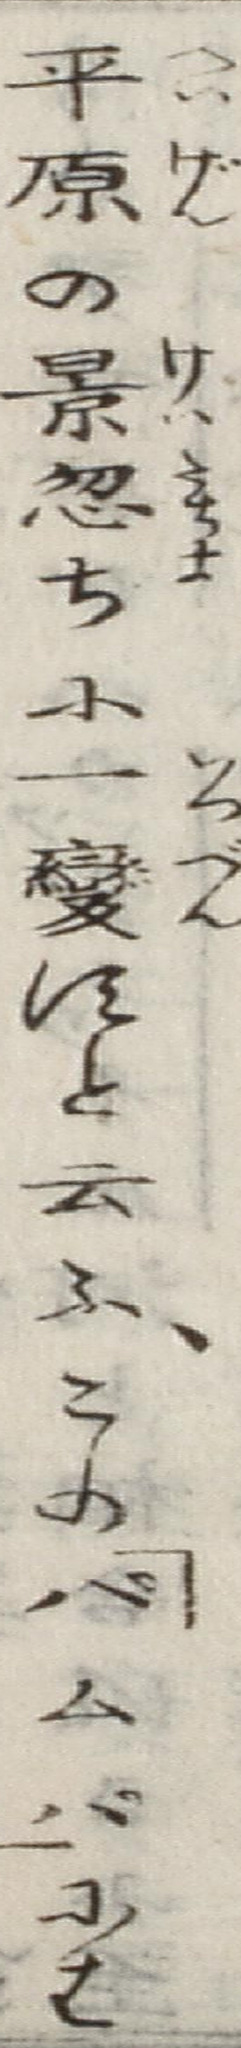平原の景忽ちに一変すと云ふ、この「パムパ」には
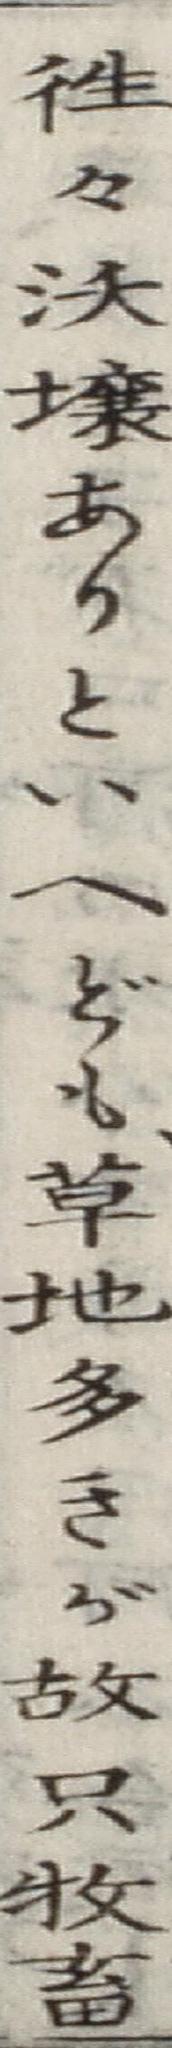往々沃壌ありといへども、草地多きが故只牧畜
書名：訓蒙　天然地理學　上
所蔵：東京大学地震研究所図書室 Earthquake Research Institute Library, The University of Tokyo, JAPAN
